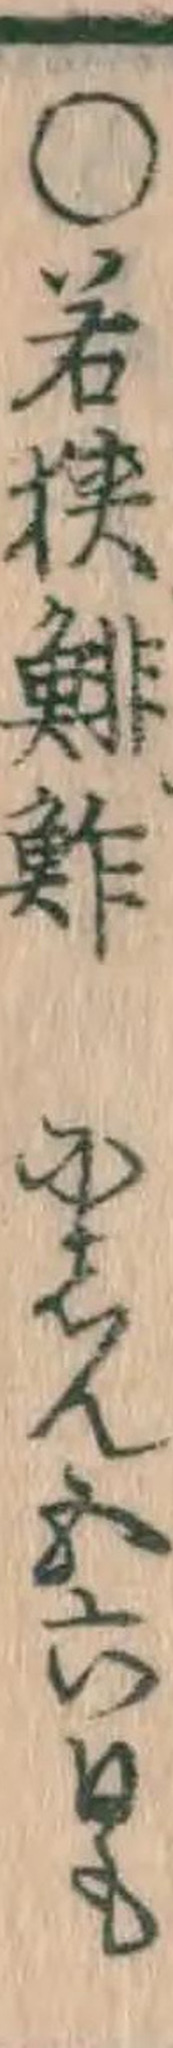○若狭鯡鮓にしん五六日も
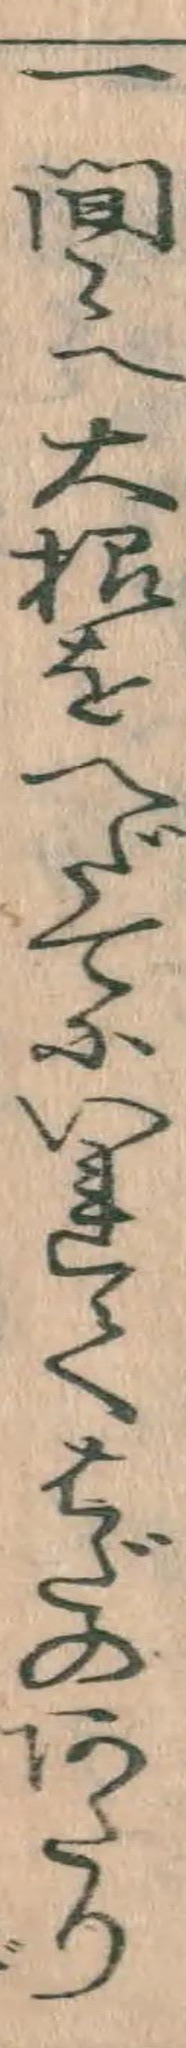一間々へ大根をへだてにいれてはだのあたり
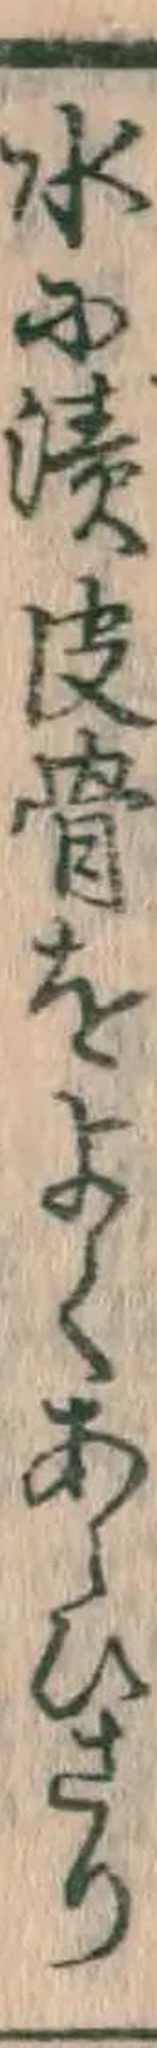水に漬皮骨をよくあらひさり
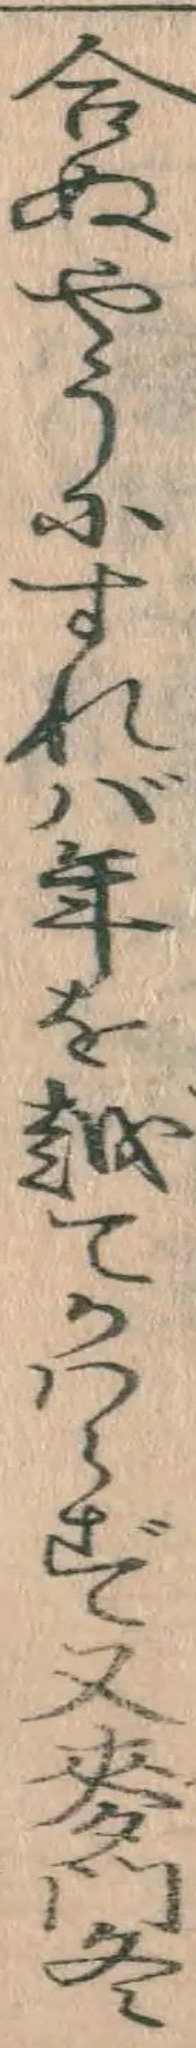合ぬやうにすれば年を越てかはらず又麦門冬
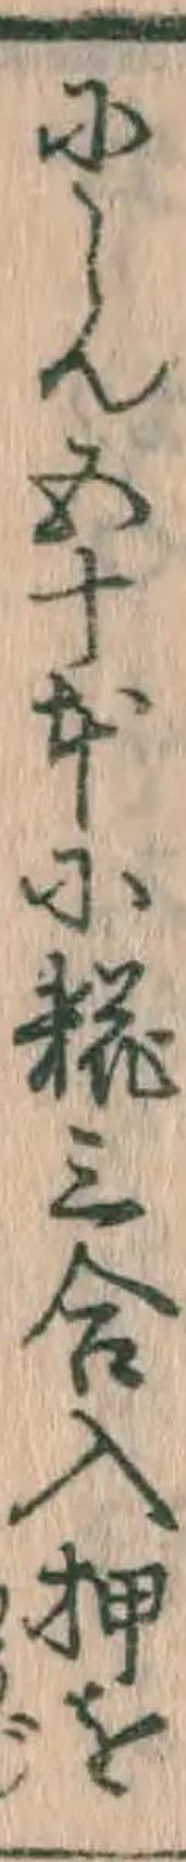にしん五十本に糀三合入押を
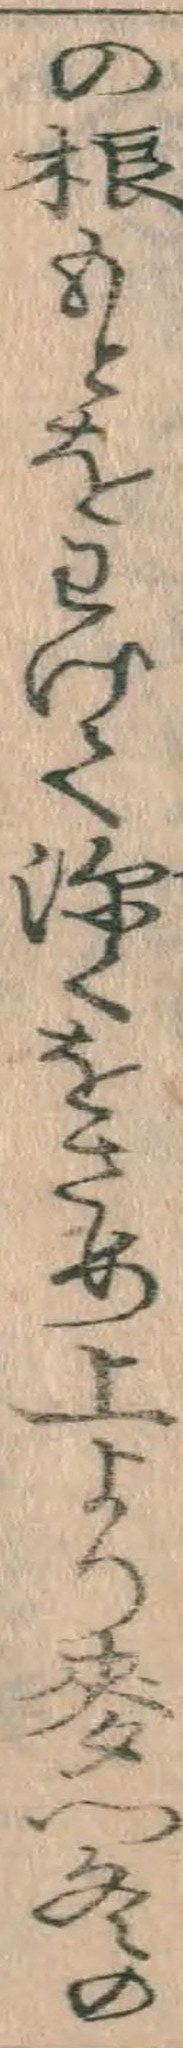の根もとをわけて深くをさめ上より麦門冬の
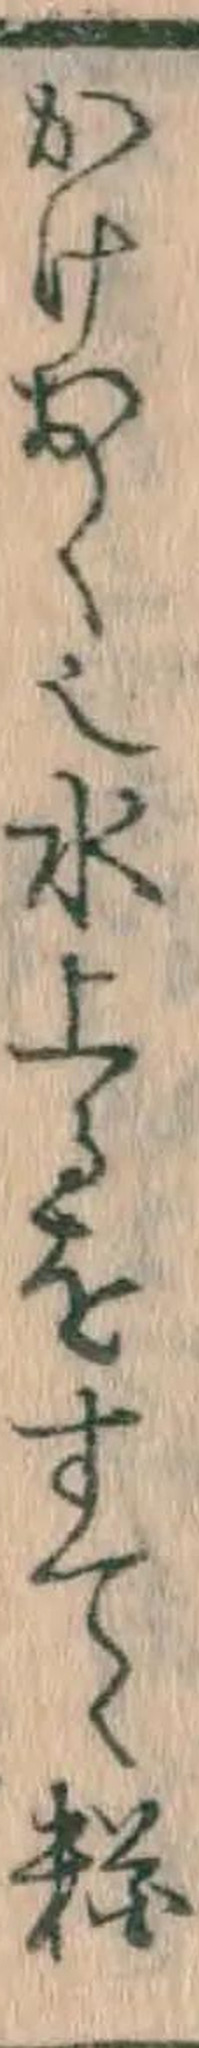かけおく也水上るをすてゝ糀
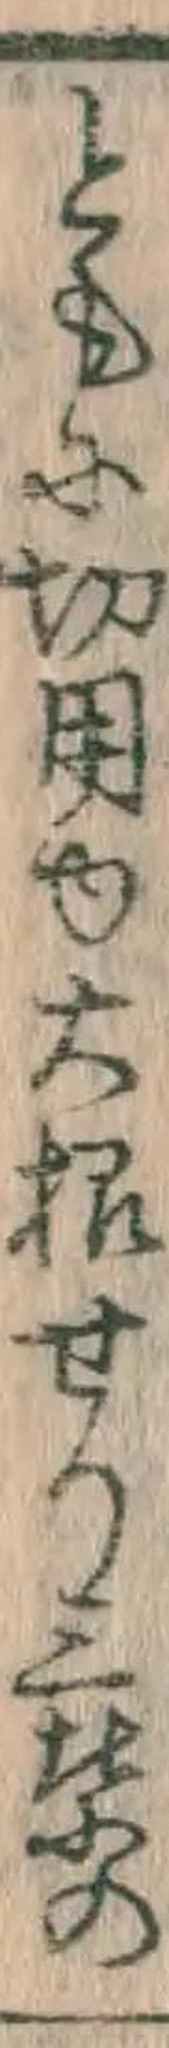ともに切用ゆ大根せり三葉の
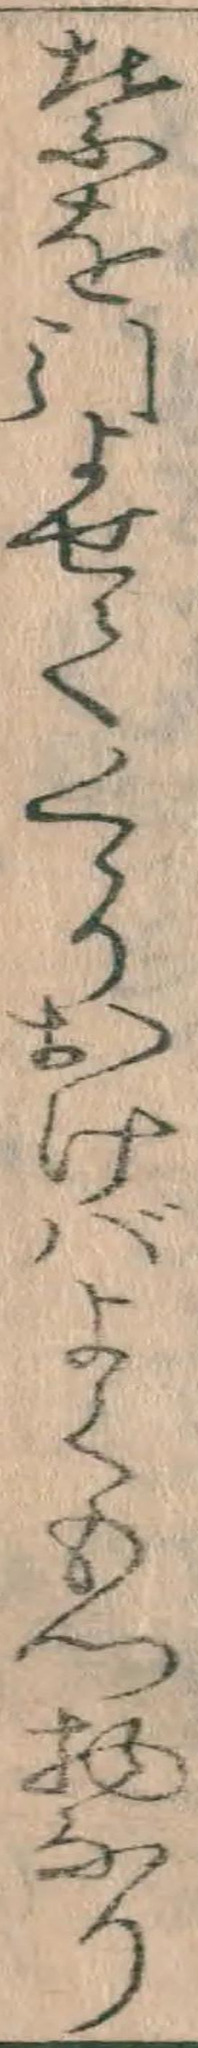葉を引よせてくゝりおけばよくもつ物なり
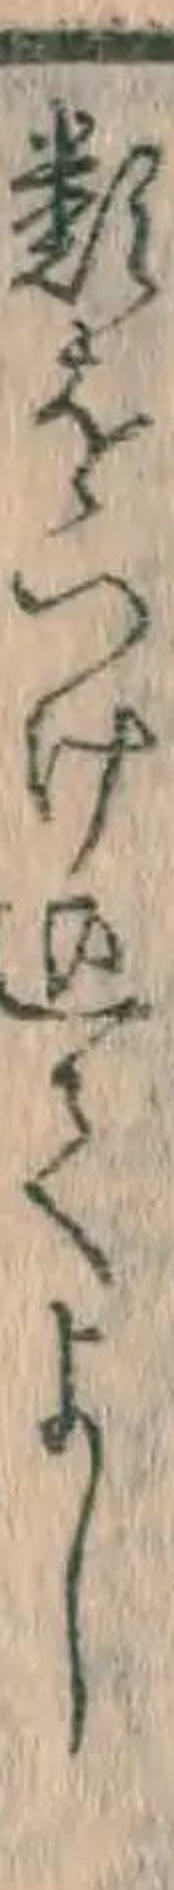類をつけ込てよし
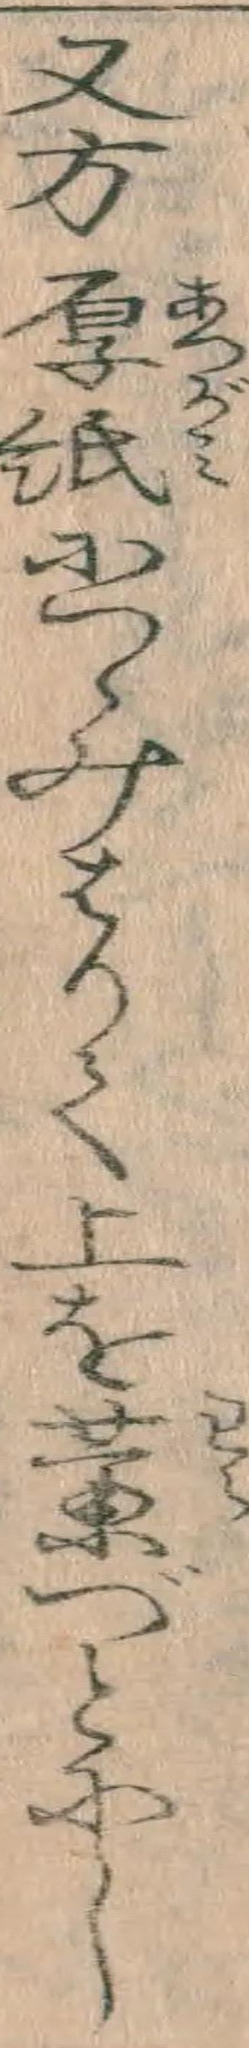又方厚紙につゝみはりて上を藁づとにし
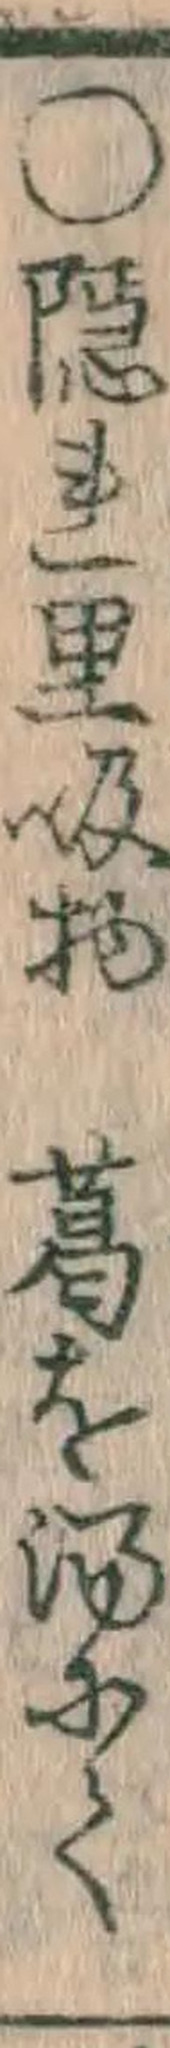○隠れ里吸物葛を湯にて
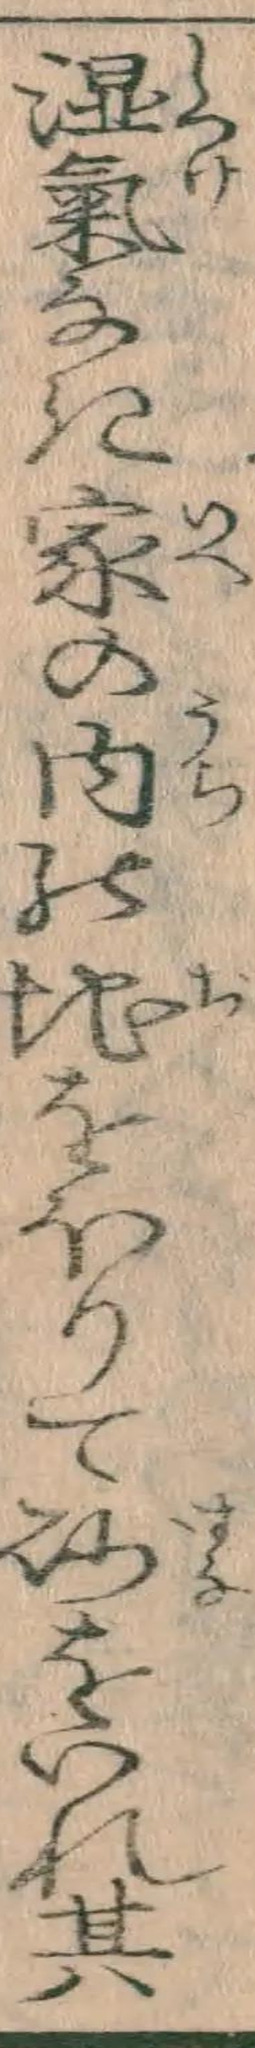湿気なき家の内の地をほりて砂をいれ其
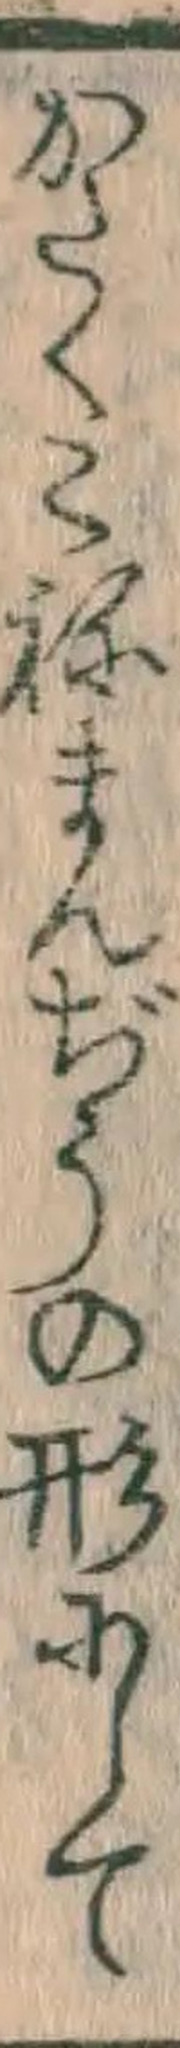かたくこねまんぢうの形にして
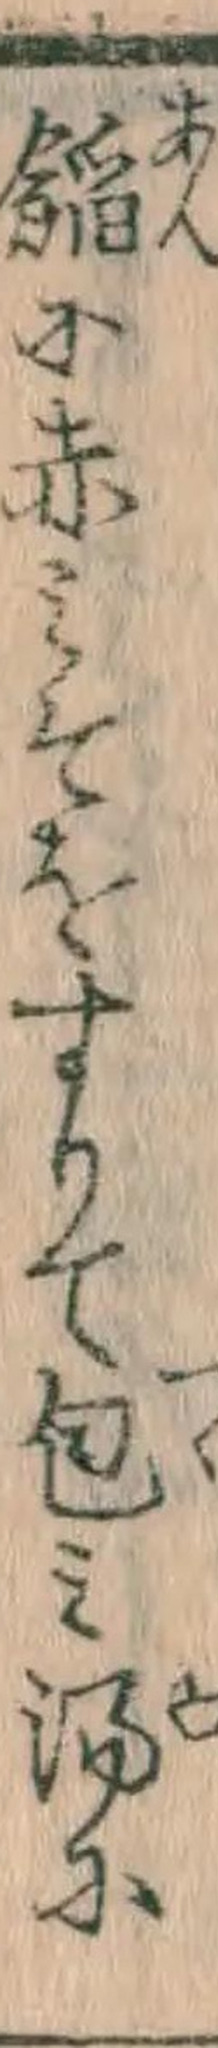餡に赤みそをすりて包み湯に
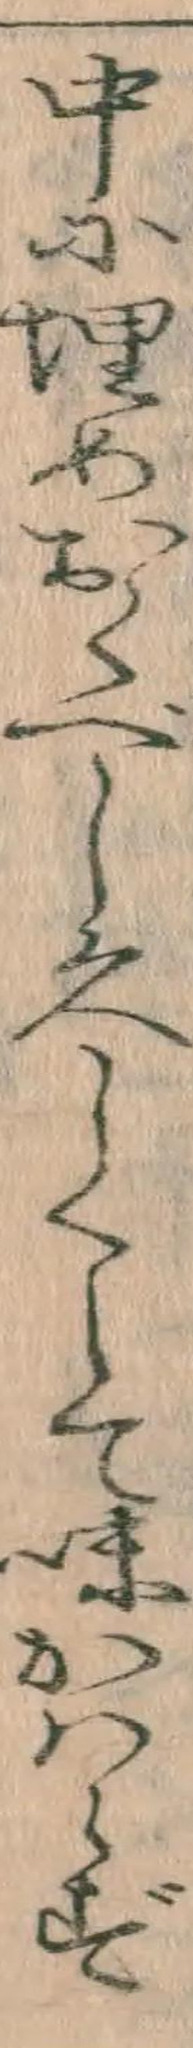中に埋めおくべし久しくして味かはらず
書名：広益秘事大全 3巻. [5]
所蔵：国立国会図書館 National Diet Library, JAPAN
